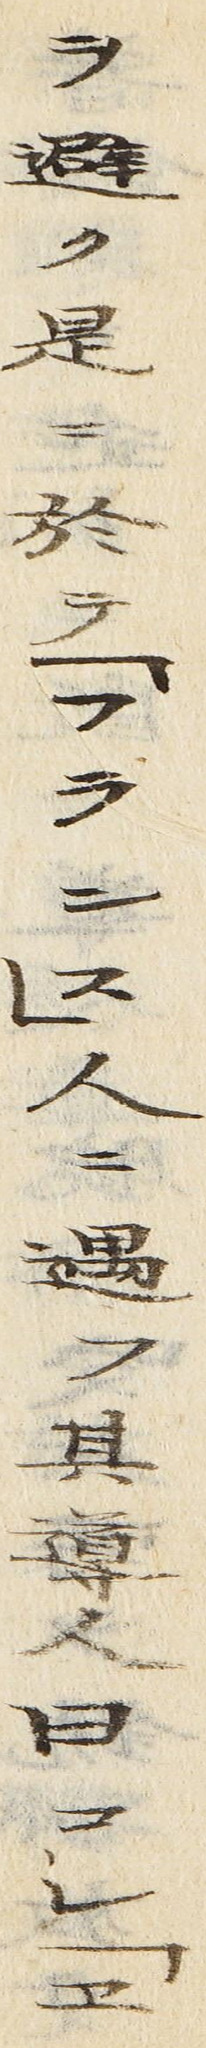ヲ避ク是ニ於テ「フランス」人ニ遇フ其導人曰コレ「ヱ
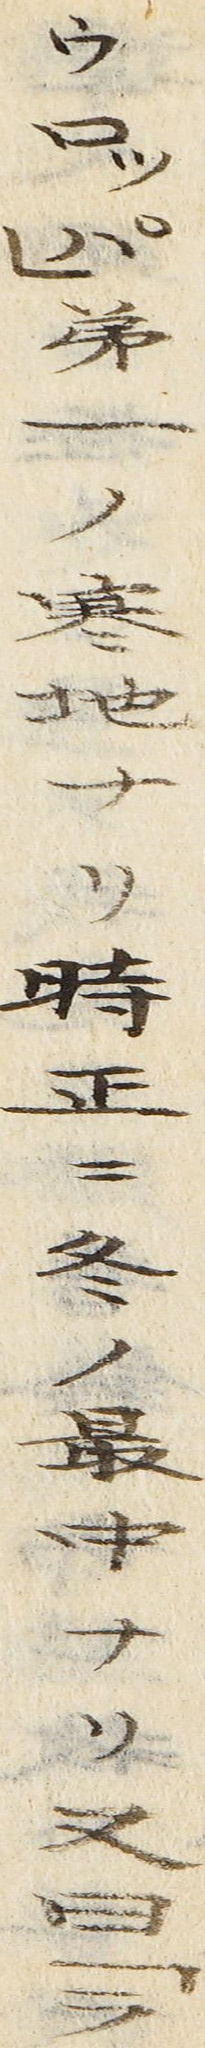ウロッパ」第一ノ寒地ナリ時正ニ冬ノ最中ナリ又曰「ラ
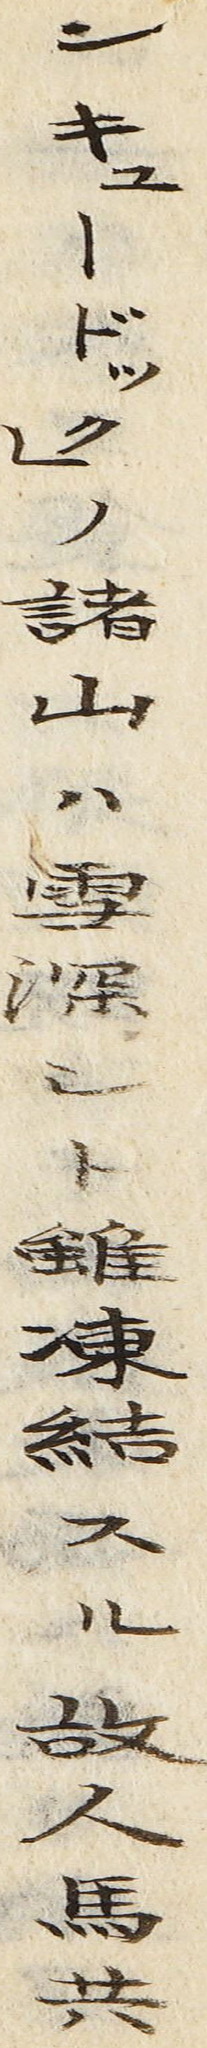ンキュードック」ノ諸山ハ雪深シト雖凍結スル故人馬共
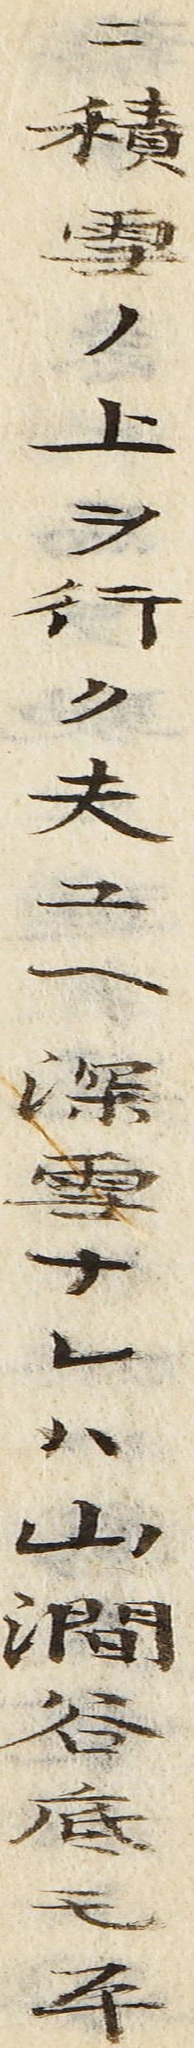ニ積雪ノ上ヲ行ク夫ユヘ深雪ナレハ山澗谷底モ平
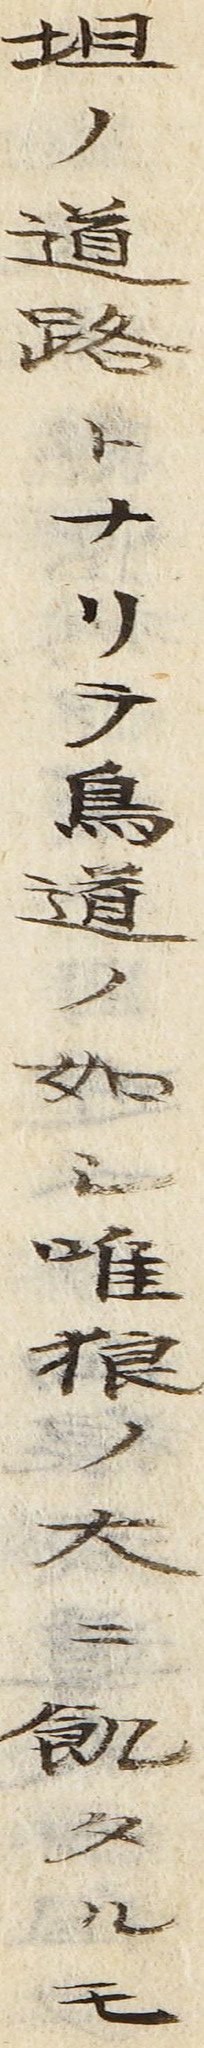坦ノ道路トナリテ鳥道ノ如シ唯狼ノ大ニ飢タルモ
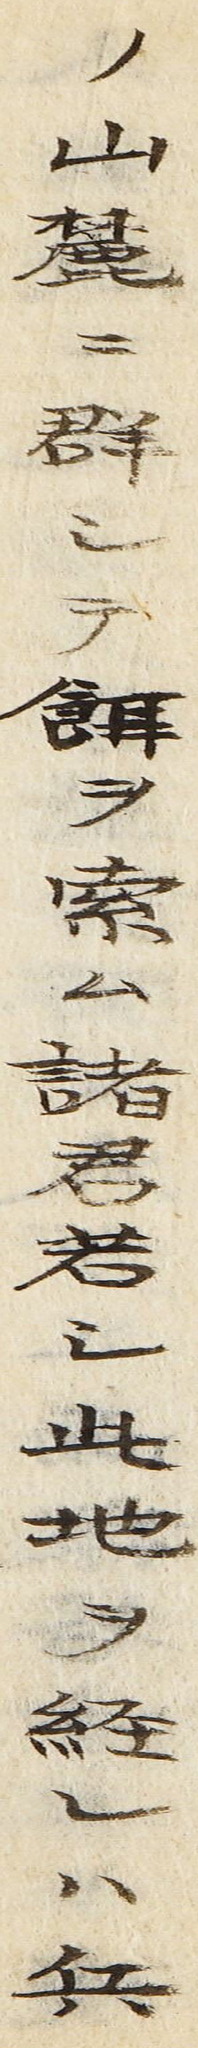ノ山麓ニ群シテ餌ヲ索ム諸君若シ此地ヲ経レハ兵
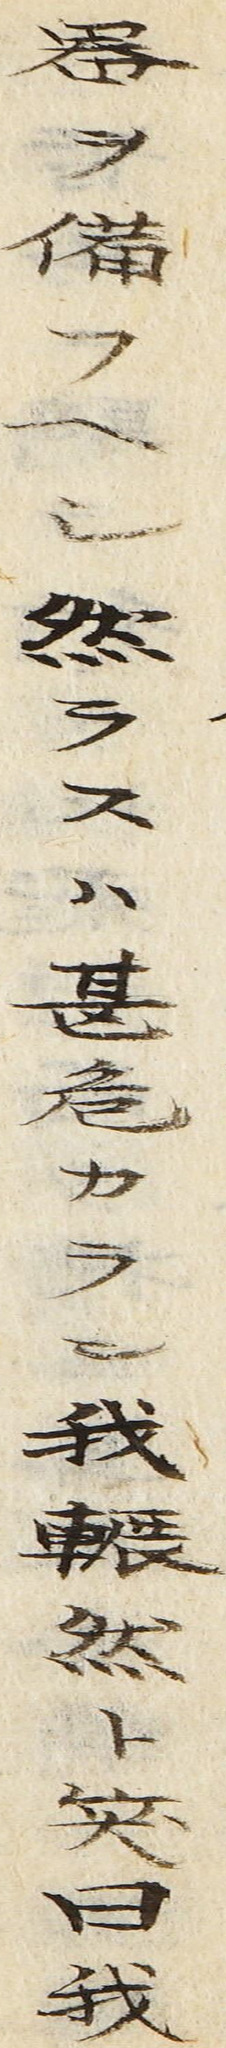器ヲ備フヘシ然ラスハ甚危カラン我輾然ト笑曰我
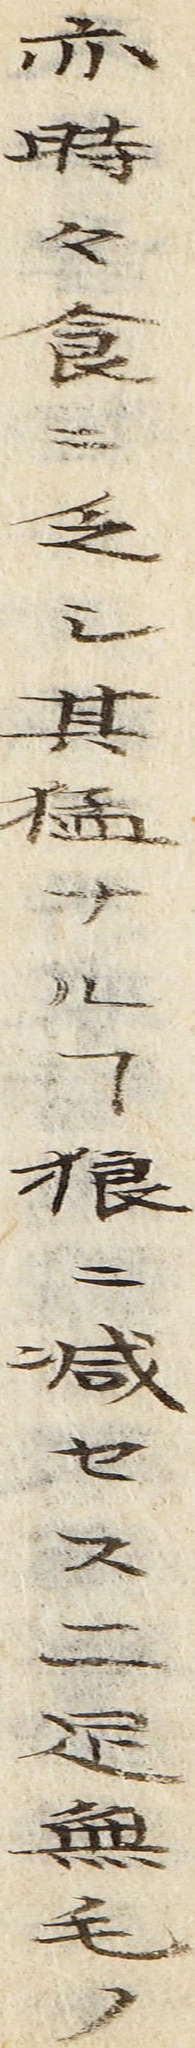亦時々食ニ乏シ其猛ナルコト狼ニ減セス二足無毛ノ
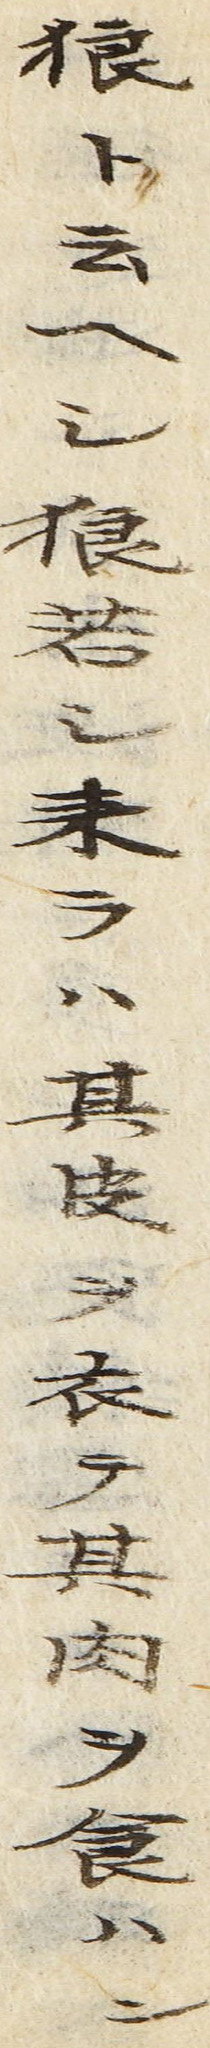狼ト云ヘシ狼若シ来ラハ其皮ヲ衣テ其肉ヲ食ハン
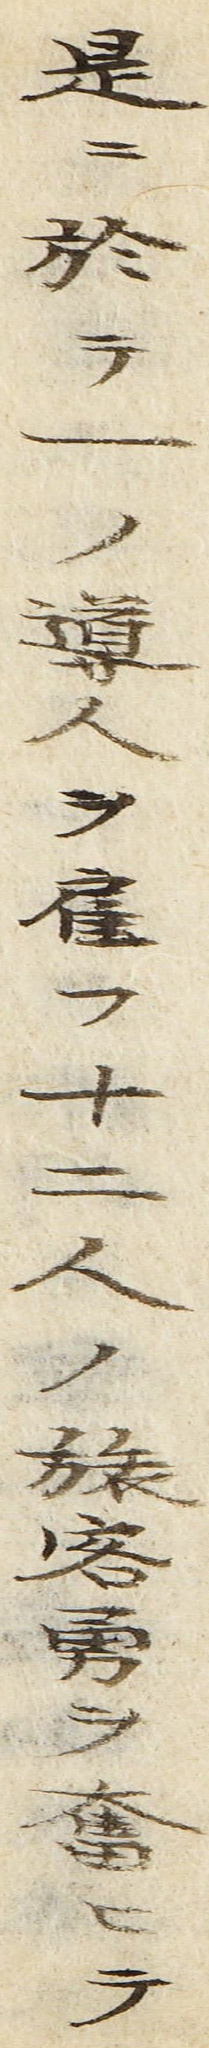是ニ於テ一ノ導人ヲ雇フ十二人ノ旅客勇ヲ奮ヒテ
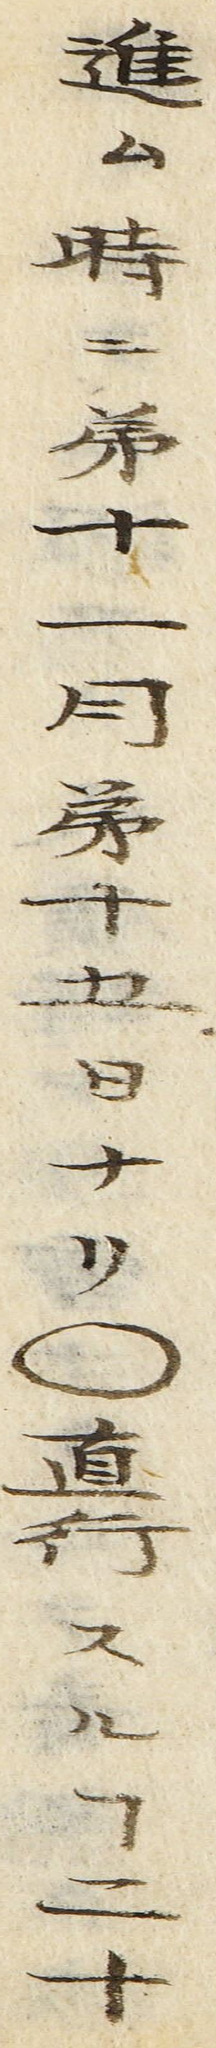進ム時ニ第十一月第十五日ナリ◯直行スルコト二十

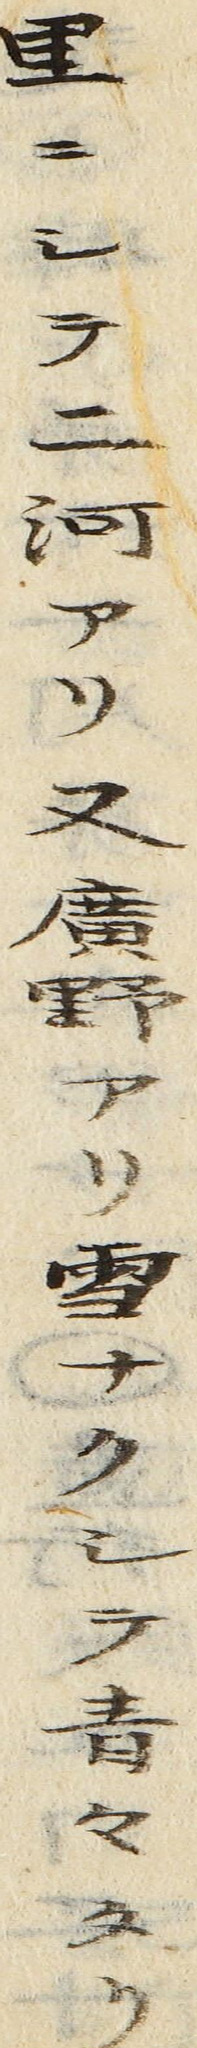里ニシテ二河アリ又広野アリ雪ナクシテ青々タリ
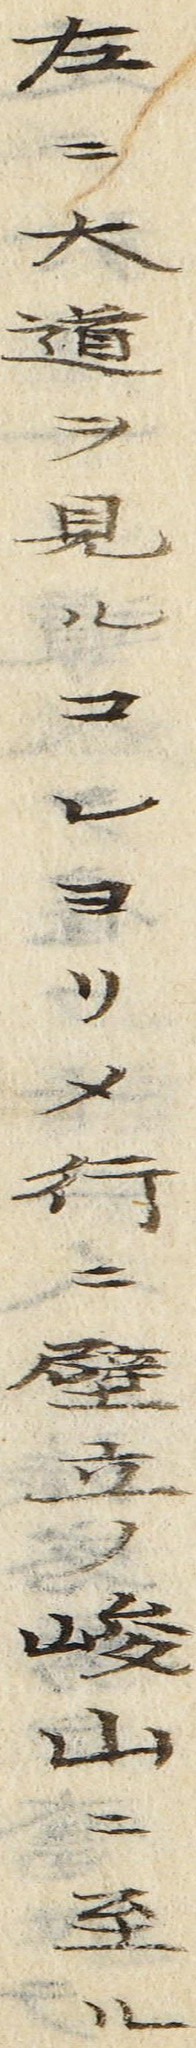左ニ大道ヲ見ルコレヨリシテ行ニ壁立ノ峻山ニ至ル
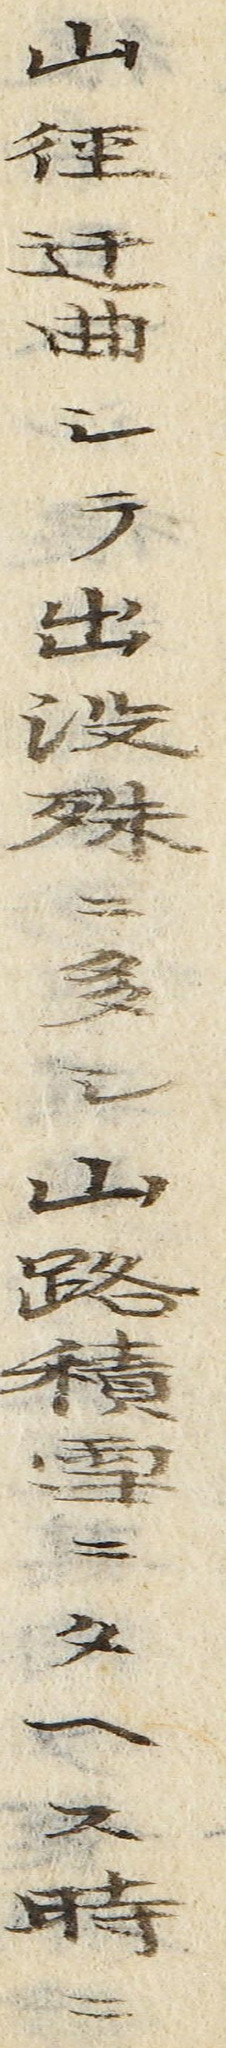山径迂曲シテ出没殊ニ多シ山路積雪ニタヘス時ニ
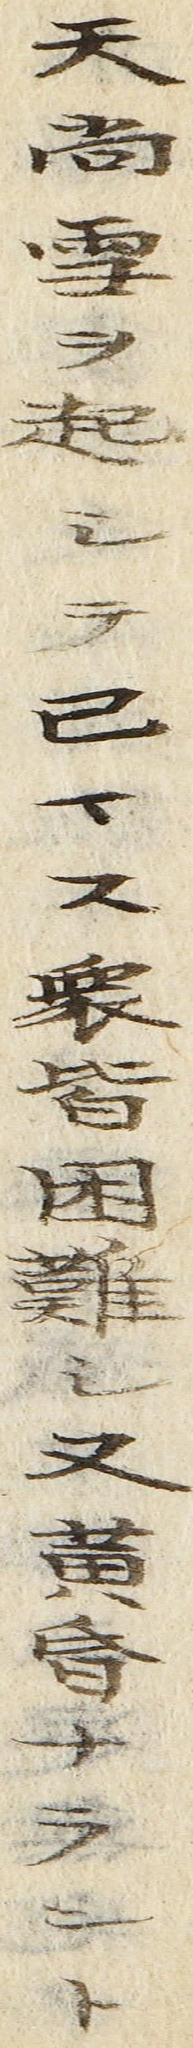天尚雪ヲ起シテ已マス衆皆困難シ又黄昏ナラント
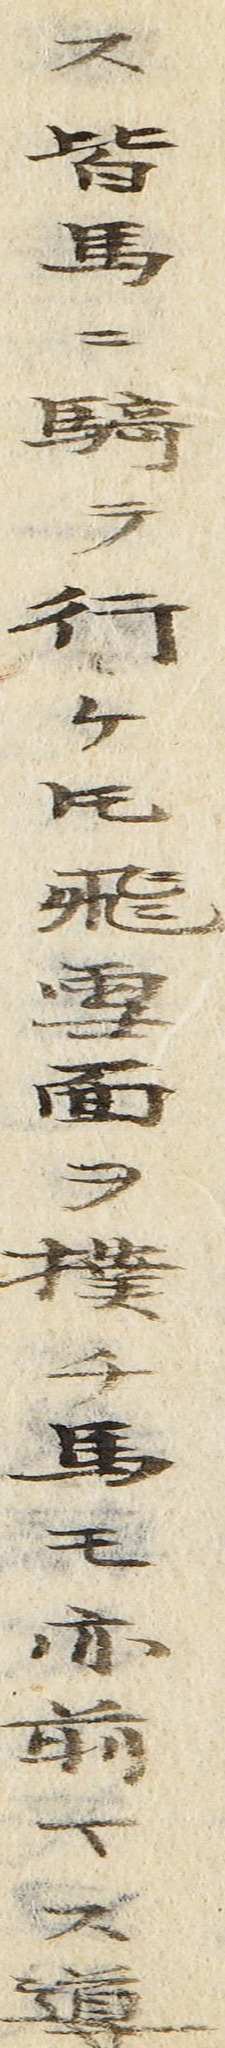ス皆馬ニ騎テ行ケトモ飛雪面ヲ撲チ馬モ亦前マス導
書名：漂流紀事
